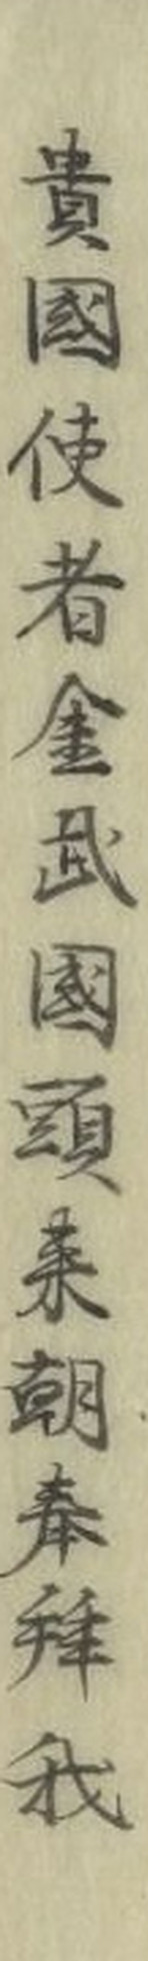貴国使者金武国頭来朝奉拝我
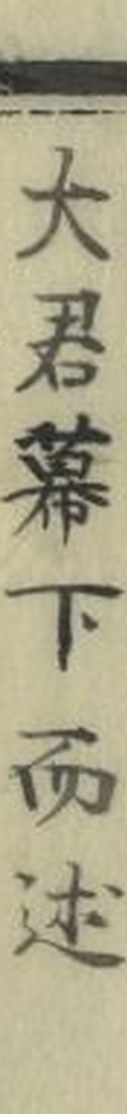大君幕下而述
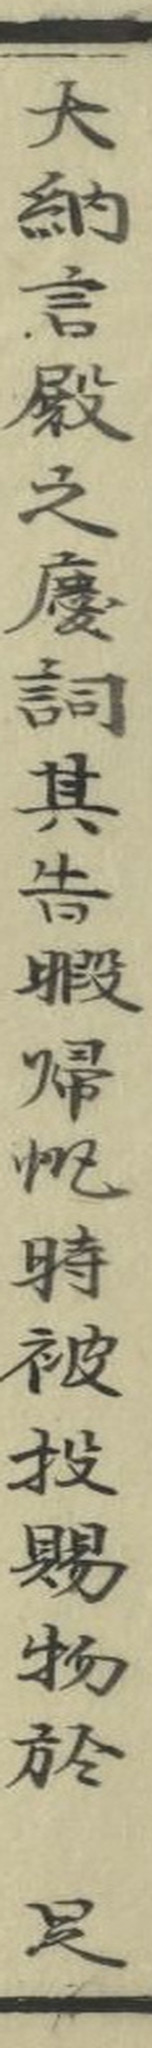大納言殿之慶詞其告暇帰帆時被投賜物於兄
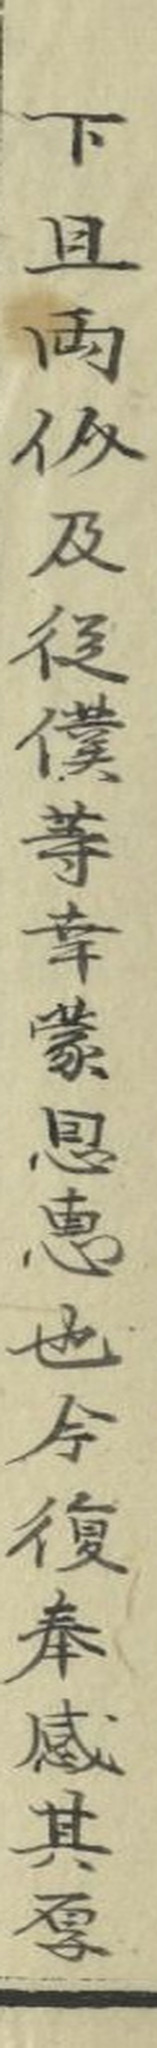下且両价及従僕等幸蒙恩恵也今復奉感其厚
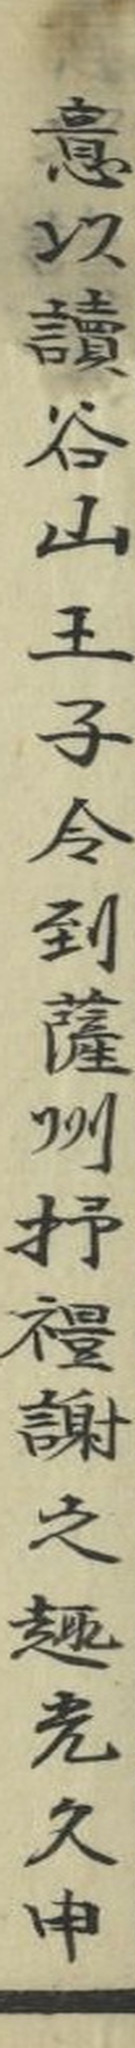意以読谷山王子令到薩州抒礼謝之趣充久申
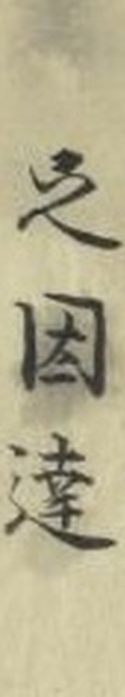之因達
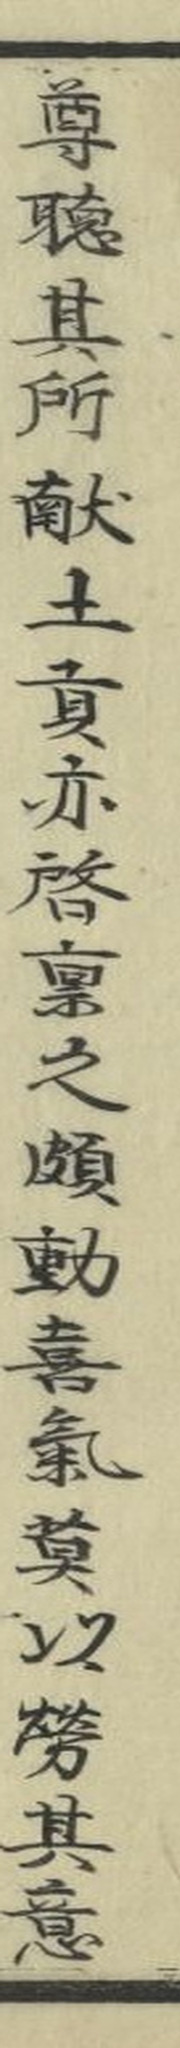尊聴其所献土貢亦啓稟之頗動喜気莫以労其意
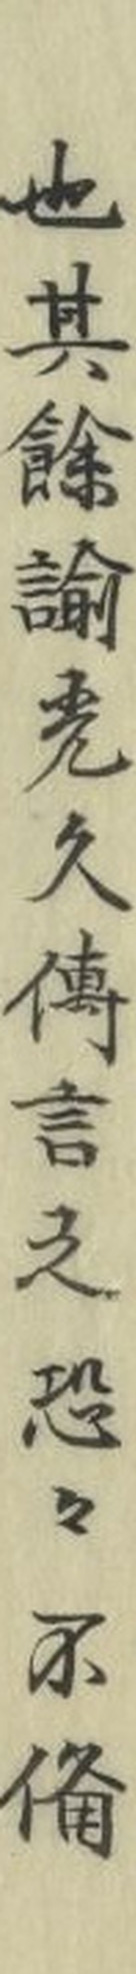也其余喩充久伝言之恐々不備
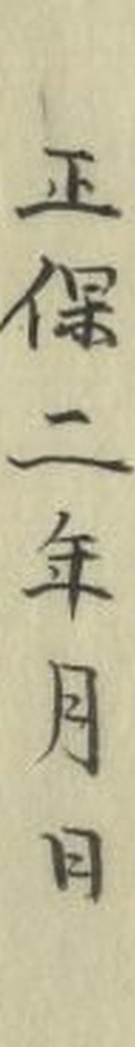正補保二月日
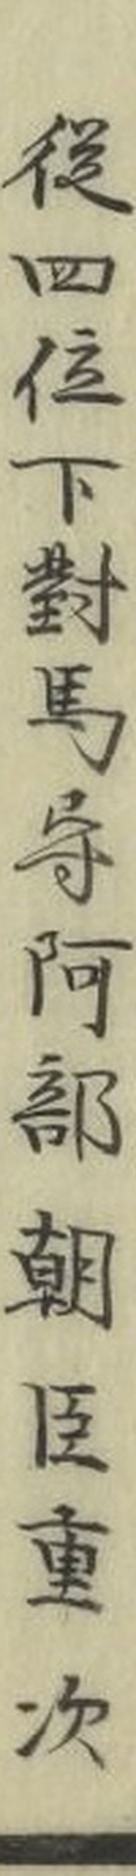従四位下對馬守阿部朝臣重次
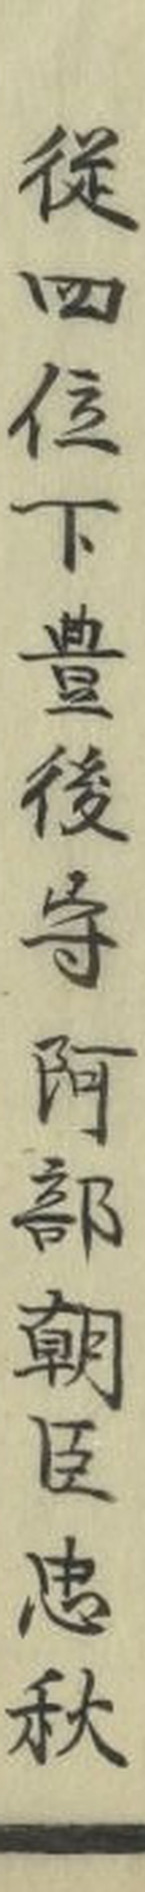従四位下豊後守阿部朝臣忠秋
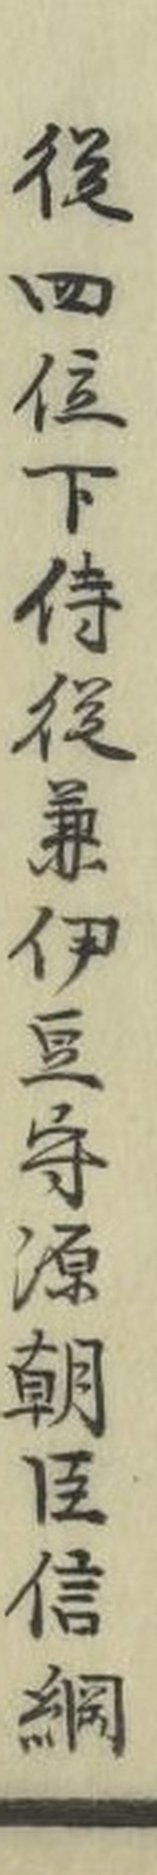従四位下侍従兼伊豆守源朝臣信綱
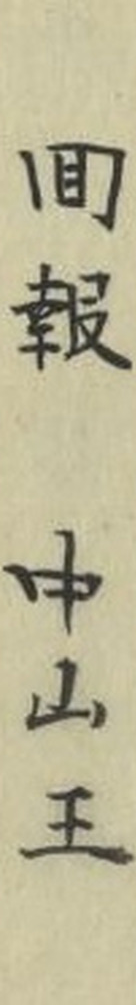回報中山王
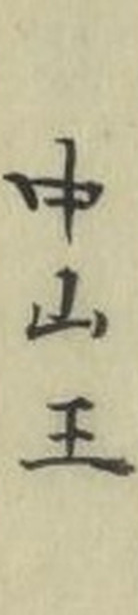中山王

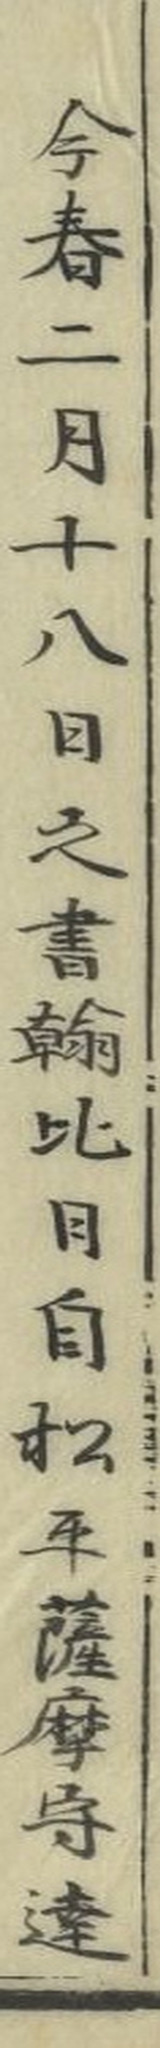今春二月十八日之書翰此月自松平薩摩守達
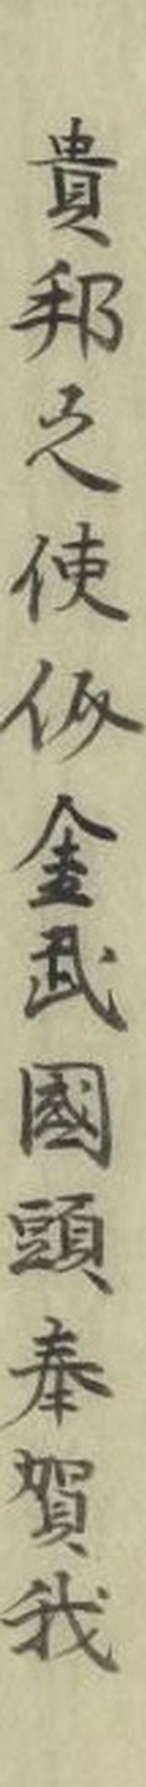貴邦之使价金武国頭奉賀我
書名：琉球往来（上）
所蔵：University of the Ryukyus Library
